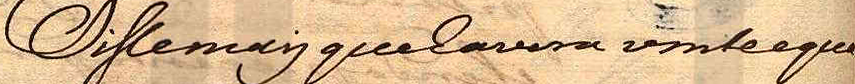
Disse mais que havera vinte e qua
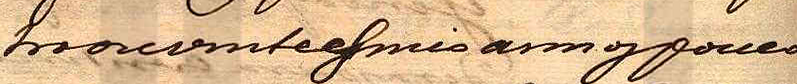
tro ou vinte e sinco annos pouco
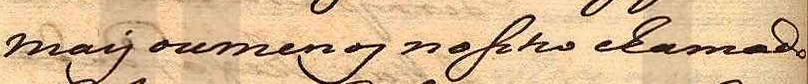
mais ou menos no sitio chamado
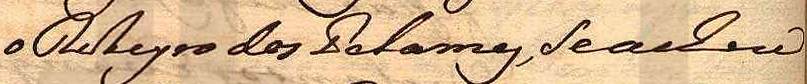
o Ribeyro dos Pelames, se achou
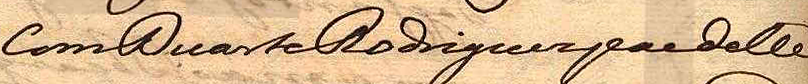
Com Duarte Rodriguez pae delle
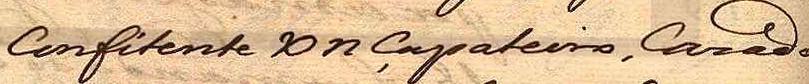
Confitente xn çapateiro, Cazado
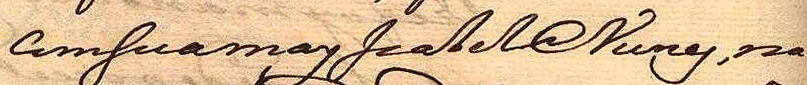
com sua may Jzabel Nunes, na
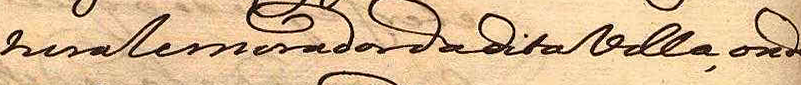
tural e morador da dita villa, onde
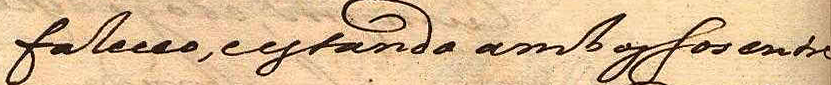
faleceo, e estando ambos sos entre
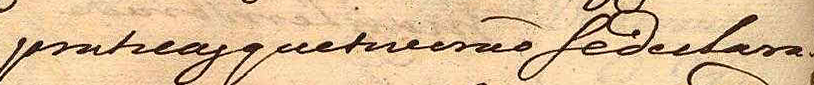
praticas que tiveraõ se declara
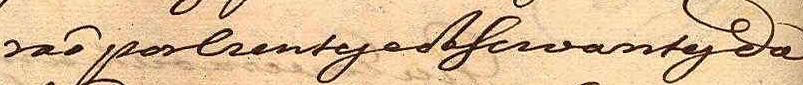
raõ por Crentes e observantes da
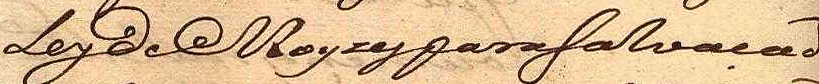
Ley de Moyzes para salvaçaõ
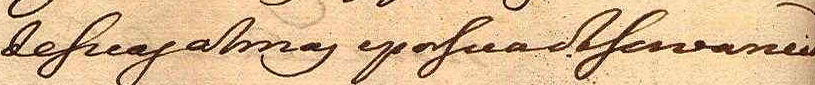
de suas almas e por sua observancia
